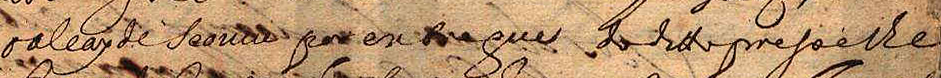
o alcayde se ouue por entregue do ditto preso e lhe
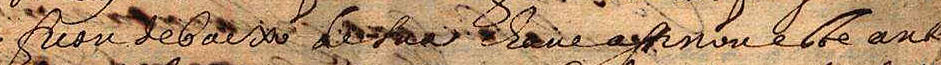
ficou debaixo de sua chaue assinou este auto
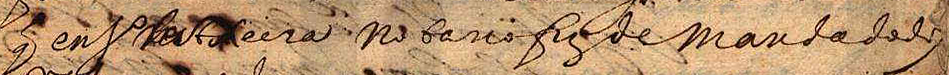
q̄ eu Jo teixeira notario fiz de mandado dos
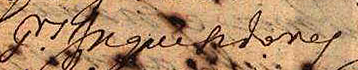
s.rs Jnquisidores
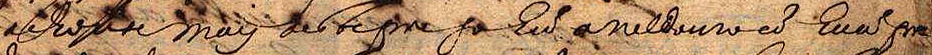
achouse mais a este presa hū anel douro cō huā pe
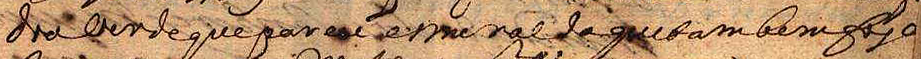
dra Verde que parece esmeralda que tambem foj e
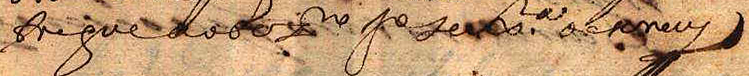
tregue ao tezro Jo teix.ra o escreuj
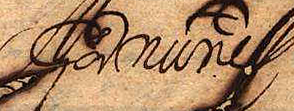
Gar nunes
